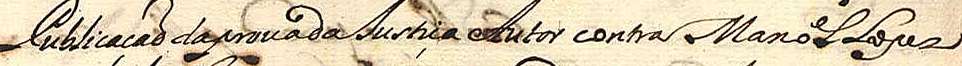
Publicação da proua da Iustiça Autor contra Manoel Lopez
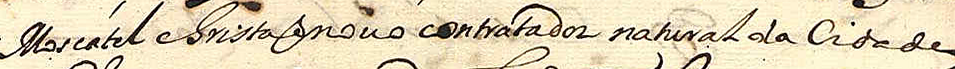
Moscatel christaõ nouo contratador natural da Cidade
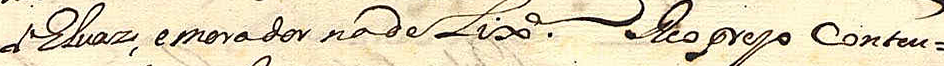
d'Eluaz, e morador na de Lixa. Reo prezo Conteu
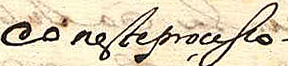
do neste proçesso
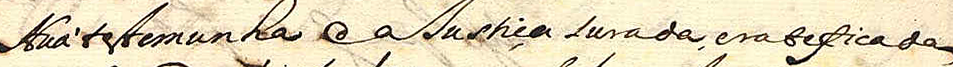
Huā testemunha da Iustiça iurada, e rateficada
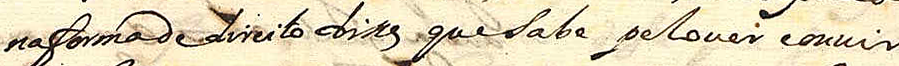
na forma de direito disse que sabe pelo uer e ouuir
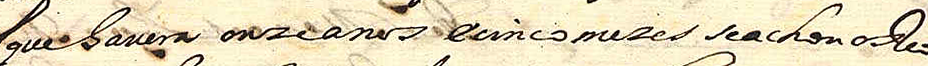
que hauera onze annos e cinco mezes se achou o Reo
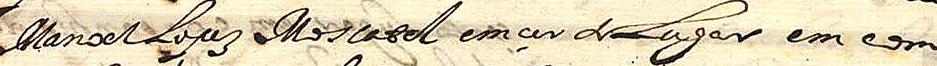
Manoel Lopez Moscatel em çerto Lugar em com
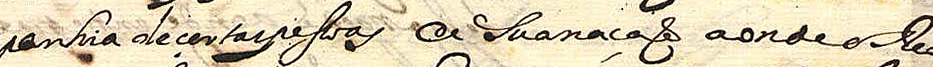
panhia de çertas pessoas de sua naçaõ aonde o Reo
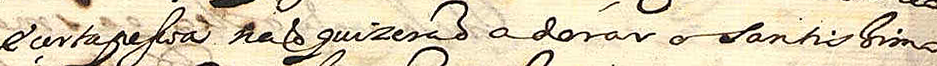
& çerta pessoa naõ quizerão adorar o santissimo
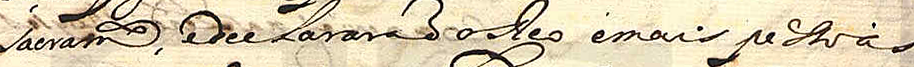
sacramto, e decLararaõ o Reo e mais pessoas
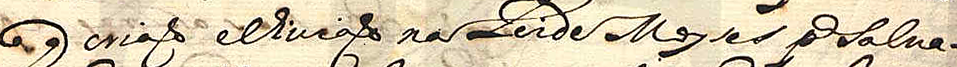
q̄ criaõ e Viuiaõ na Lei de Mojses pa Salua
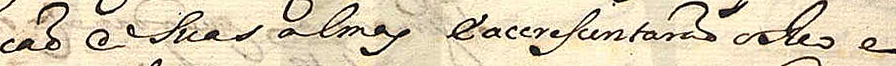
caõ de Suas almas & accrescentarão o Reo e
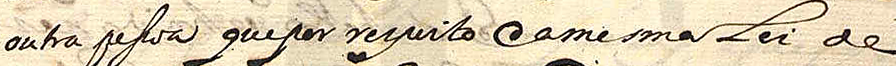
outra pessoa que por respeito da mesma Lei de
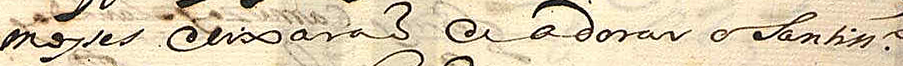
mojses deixaraõ de adorar o Santiss.o
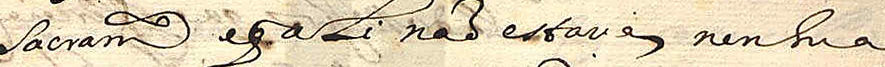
Sacramto e q̄ aLi naõ estaua nenhua
